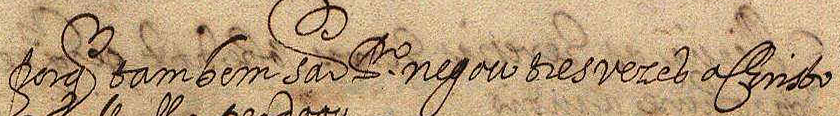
porq̄ tambem saõ P.o negou tres vezes a Christo
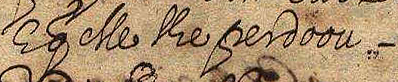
E q̄ elle lhe perdoou -
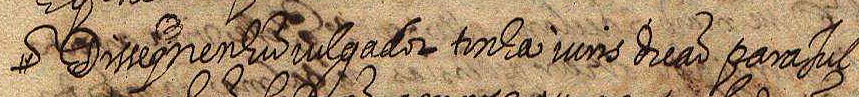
item Disse q̄ nenhū iulgador tinha iurisdiçaõ para Jul
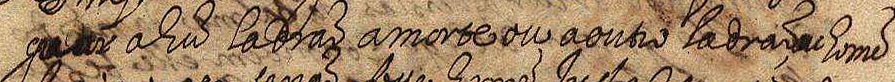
guar a hū ladraõ a morte ou a outro ladraõ, ou homē
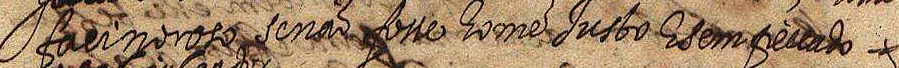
facinoroso se não fosse homē Iusto E sem peccado
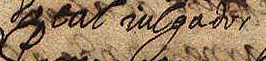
o tal iulgador
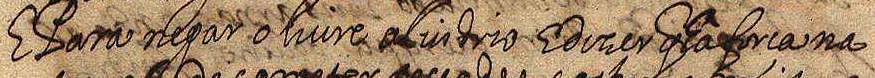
E Para negar o liure aluidrio E dizer q̄ ha força na
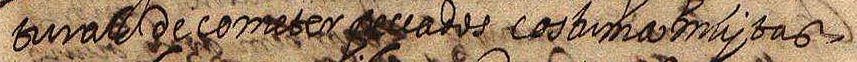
tural de cometer peccados costuma mujtas
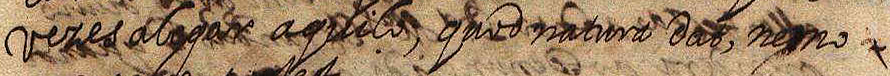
vezes alegar aquilo, quod natura dat, nemo
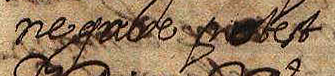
negare potest
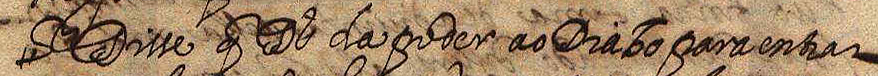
item Disse q̄ Ds̄ da poder ao Diabo para entrar
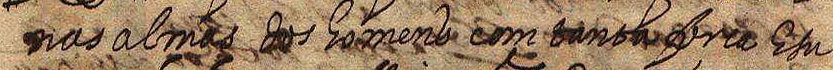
nas almas dos homens com tanta força E su
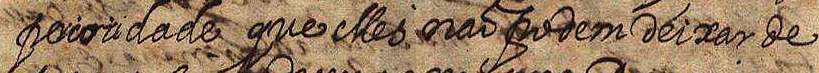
perioridade que elles naõ podem deixar de
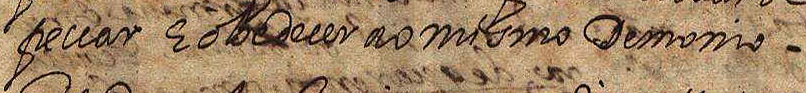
peccar E obedecer ao mesmo Demonio.
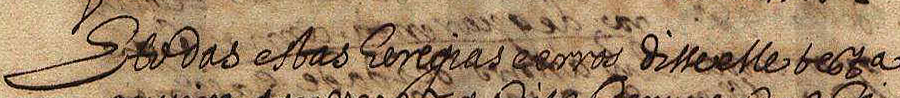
E todas estas heregias e erros disse elle testa.
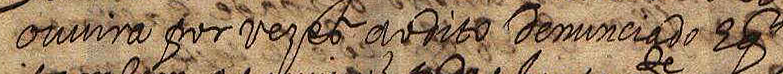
ouuira por vezes ao dito denunciado E q̄
